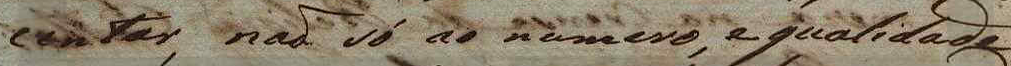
centar, naõ só ao numero, e qualidade
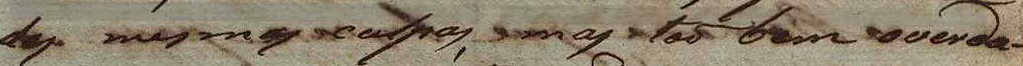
das mesmas culpas, mas taõbem o verda
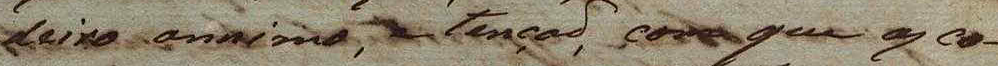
deiro annimo, e tençaõ, com que as co
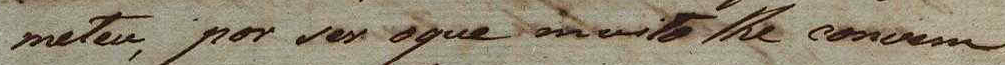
meteu, por ser o que muito lhe convem
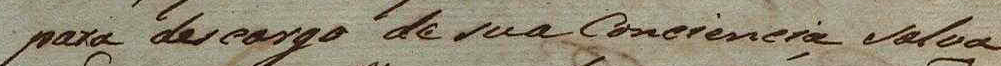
para descargo de sua conciencia, salva
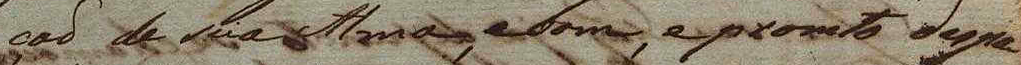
çaõ de sua Alma, e bom e promto despa
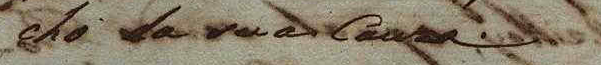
cho da sua Cauza.
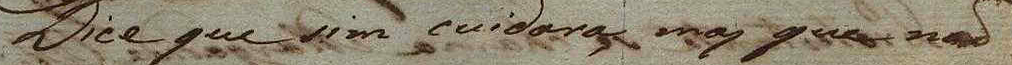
Dice que sim cuidara mas que naõ
